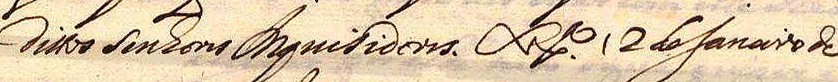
dittos senhores Inquisidores. Lx.a 12 de Janairo de
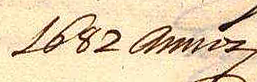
1682 annoz
